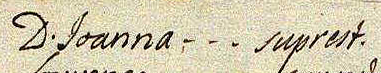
D. Ioanna. --- suprest.
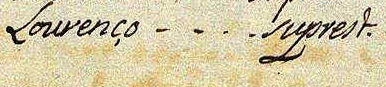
Lourenço - - - - suprest.
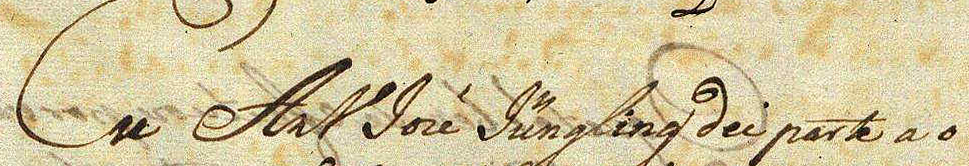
Eu Ant.o Iozé Iūngling dei parte ao
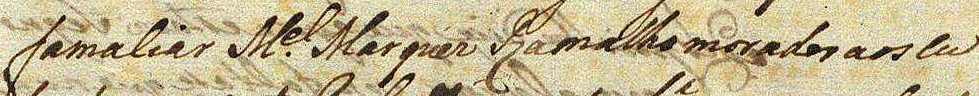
famaliar M.el Marquez Ramalho morador aos cu
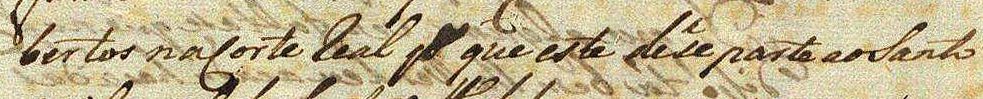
bertos na Corte Real pa que este dese parte ao Santo
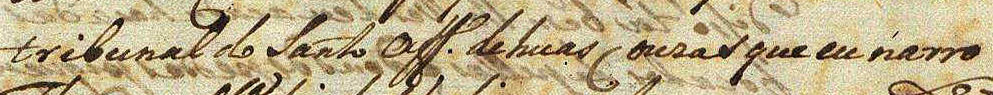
tribunal do Santo Off.o de huas Couzas que eu narro
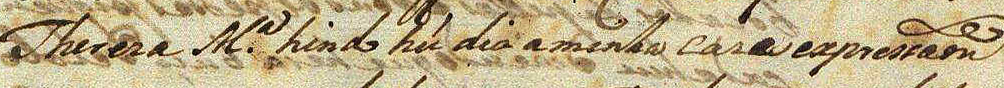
Thereza M.a hindo hū dia a minha caza e apressam.te
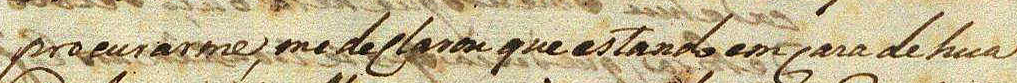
procurarme, me deClarou que estando em Caza de hua
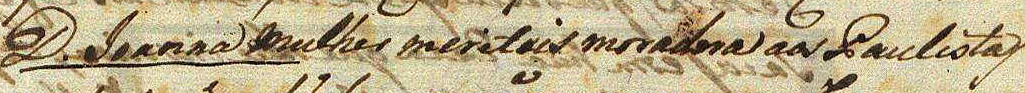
D. Ioanna mulher meretris moradora aos Paulistas
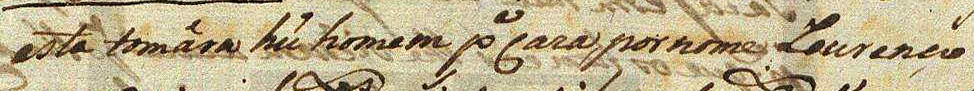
esta tomára hū homem pa Caza, por nome Lourenço
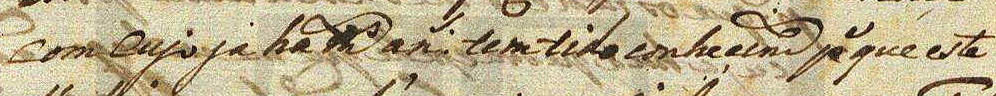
com cujo ja ha mtos ans: tem tido conheçimto pa que este
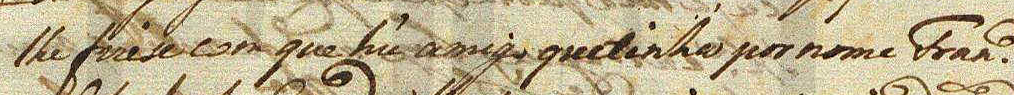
lhe fizese com que hū amigo que tinha por nome Fran.co
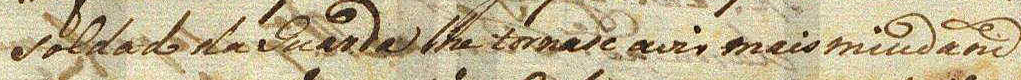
soldado da Guarda lhe tornase a vir mais miudamte
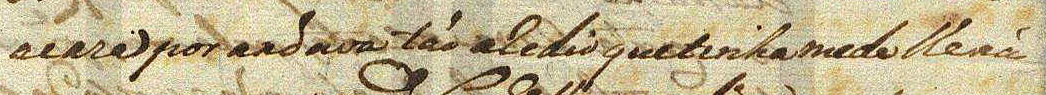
a caza por andava taõ aRedio que tinha medo lhe nã
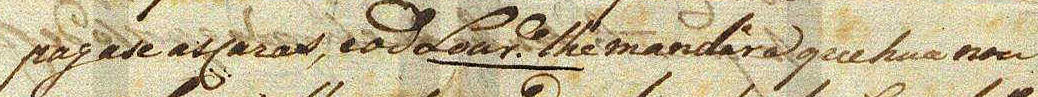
pagase as Cazas, e o do Lour.co lhe mandára que hua nou
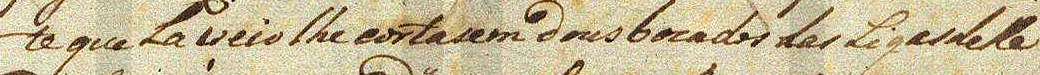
te que La ueio lhe cortasem dous bocados das Ligas delle
